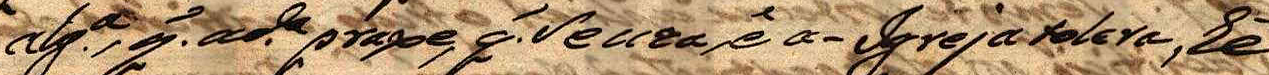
alg.a, q̄. a d.a praxe, q̄ se uza, ê a - Igreja tolera, hê
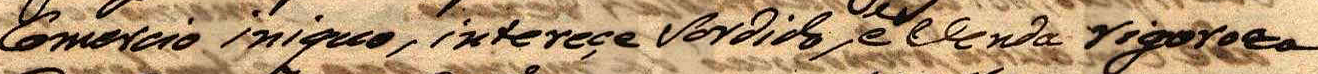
Comercio iniquo, intereçe sordido, ê venda rigoroza
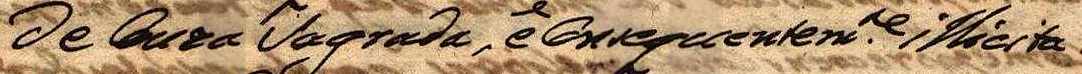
de Couza sagrada, ê consequentem.te illicita.
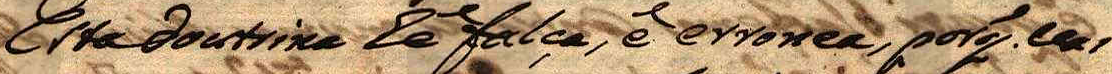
Esta doutrina hê falça, ê erronea, porq̄ vai
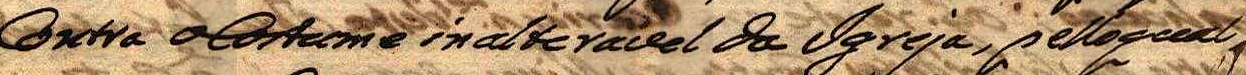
Contra o Costume inalteravel da Igreja, pello qual,
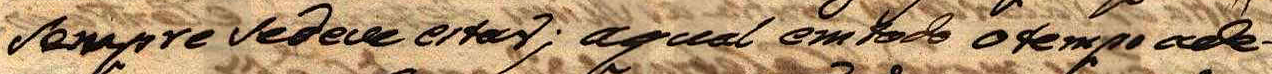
sempre se deve estar; a qual em todo o tempo ade
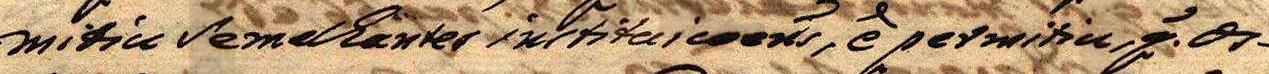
mitiu semelhantes instituicoeñs, ê permitiu, q̄. os
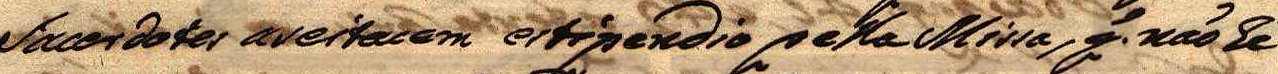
Sacerdotes aseitacem estipendio pella Missa, q̄. naõ hé
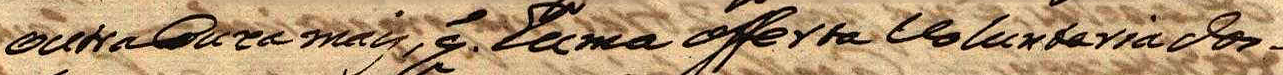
outra Couza mais, q̄. huma offerta voluntaria dos
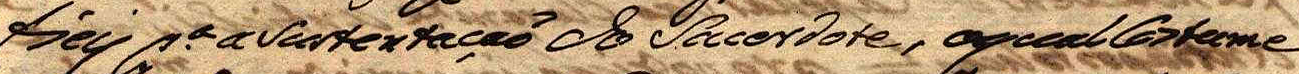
fieis p.a a sustentaçaõ do Sacerdote, o qual Costume
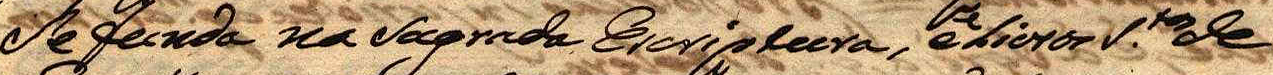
se funda na sagrada Escriptura, ê Livros s.tos de
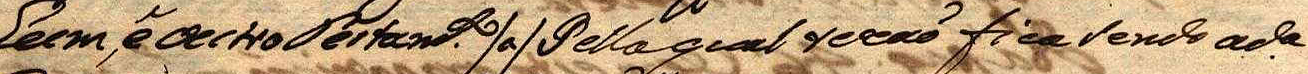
hum, ê outro Testam.to /a/ Pella qual rezaõ fica sendo a d.a
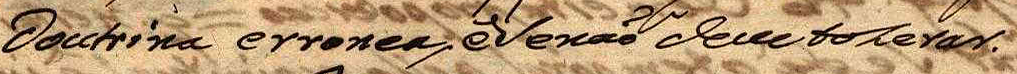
Doutrina erronea, ê se naõ deve toLerar.
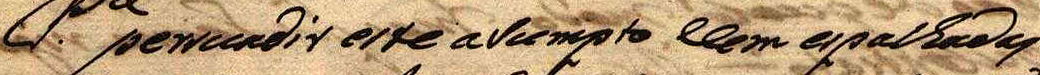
P.a persuadir este asumpto vem espalhadas
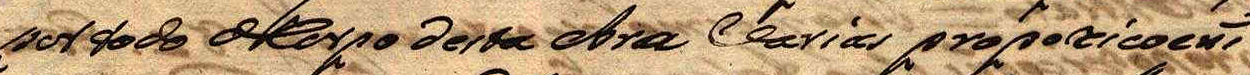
por todo o Corpo desta obra varias propozicoeñs
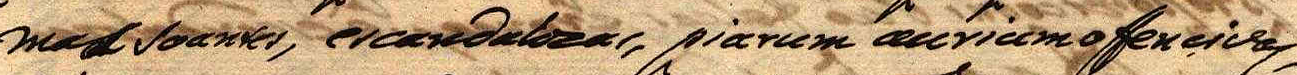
maL soantes, escandalozas, piarum aurium offençivas,
